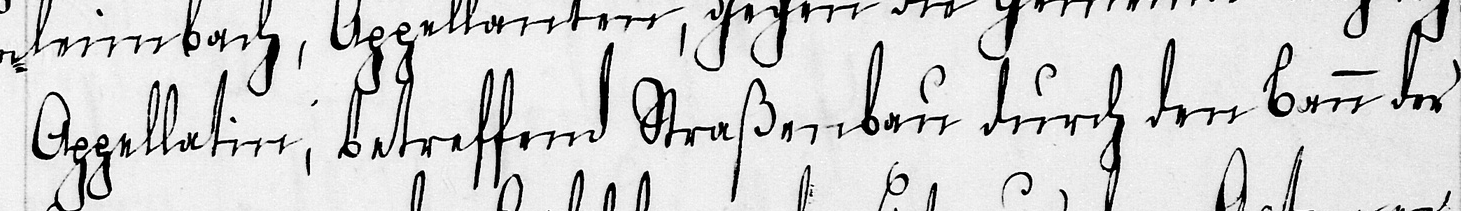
Appellatin, betreffend Straßenbau durch den Bann der
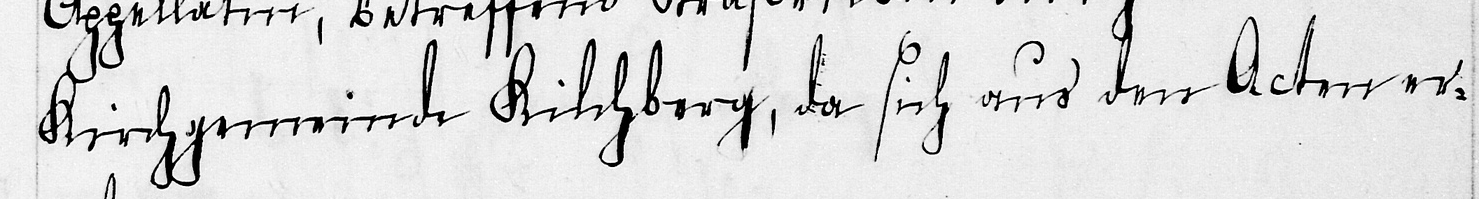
Kirchgemeinde Kilchberg, da sich aus den Acten er¬
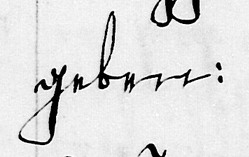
geben:
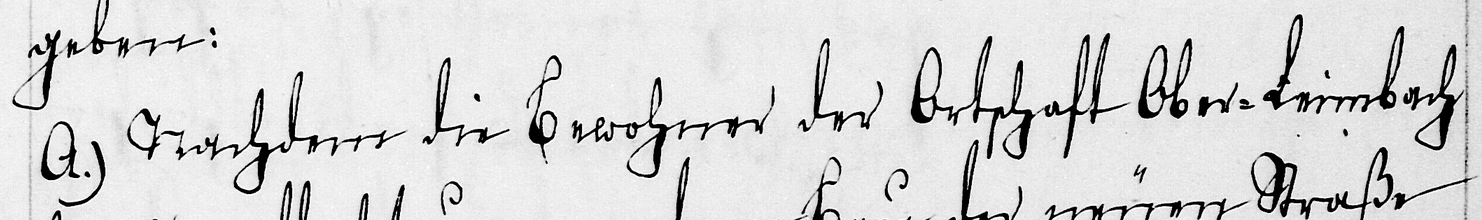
A.) Nachdem die Bewohner der Ortschaft Ober-Leimbach
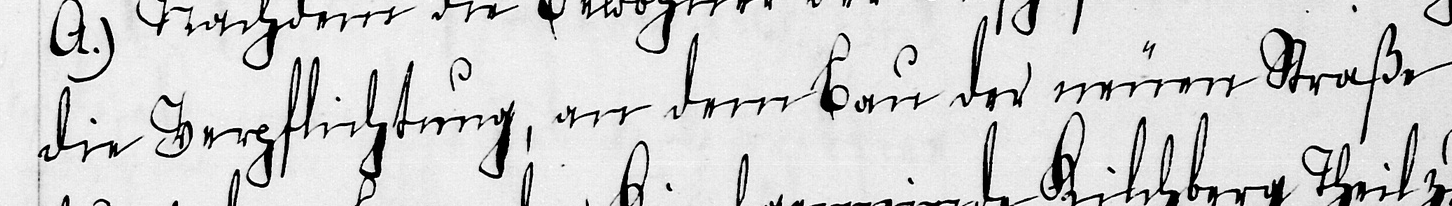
die Verpflichtung, an dem Bau der neuen Straße
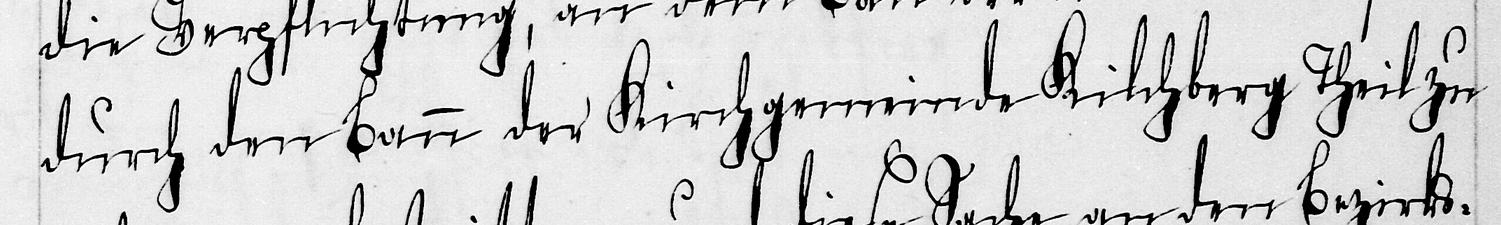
durch den Bann der Kirchgemeinde Kilchberg Theil zu
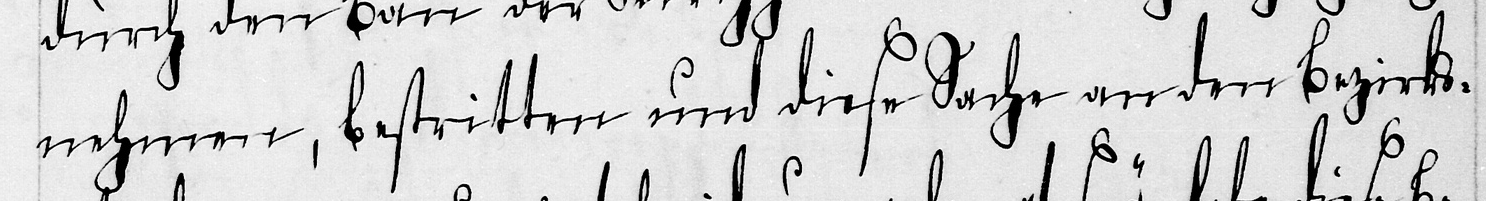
nehmen, bestritten und diese Sache an den Bezirks¬
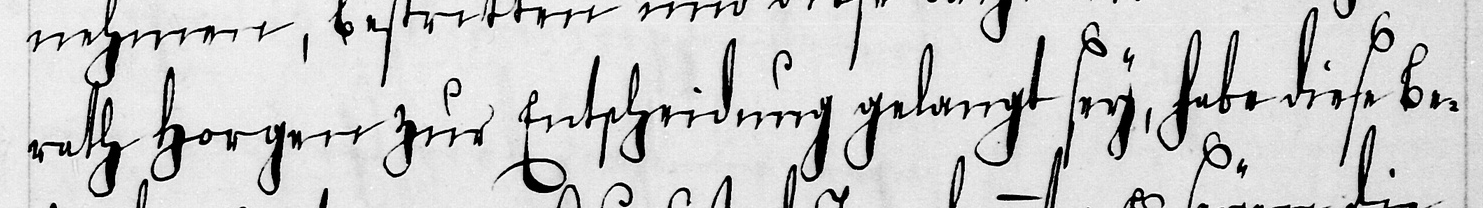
rath Horgen zur Entscheidung gelangt sey, habe diese B¬
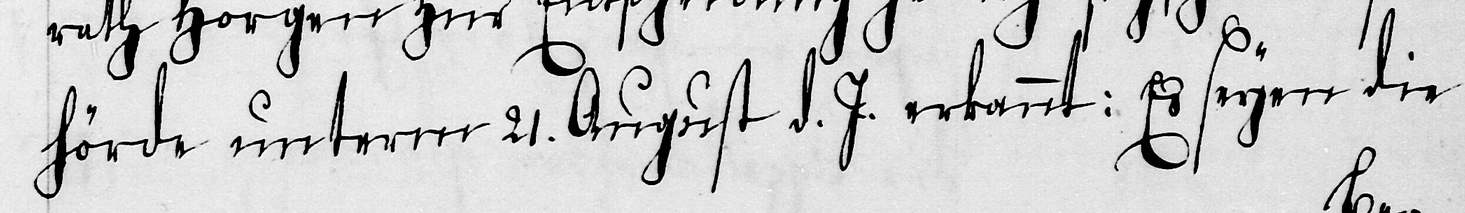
ehörde unterm 21. August d. J. erkannt: Es seyen die
